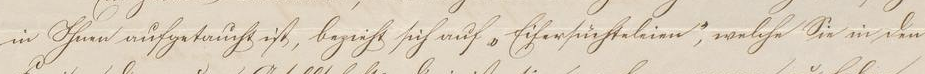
in Ihnen aufgetaucht ist, bezieht sich auf «Eifersüchteleien», welche Sie in den
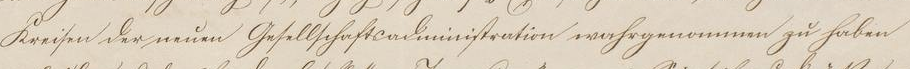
Kreisen der neuen Gesellschaftsadministration wahrgenommen zu haben
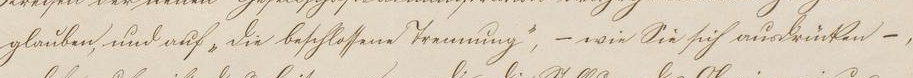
glauben, und auf «die beschlossene Trennung», – wie Sie sich ausdrücken –,
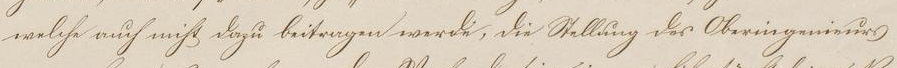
welche auch nicht dazu beitragen werde, die Stellung des Oberingenieurs
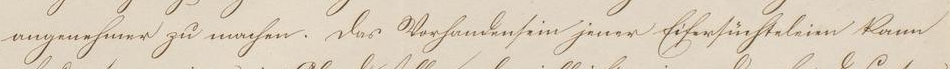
angenehmer zu machen. Das Vorhandensein jener Eifersüchteleien kann
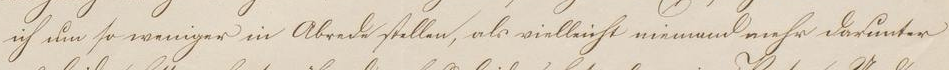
ich um so weniger in Abrede stellen, als vielleicht niemand mehr darunter
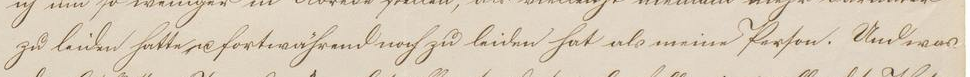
zu leiden hatte & fortwährend noch zu leiden hat als meine Person. Und was
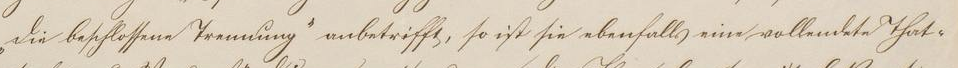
«die beschlossene Trennung» anbetrifft, so ist sie ebenfalls eine vollendete That-
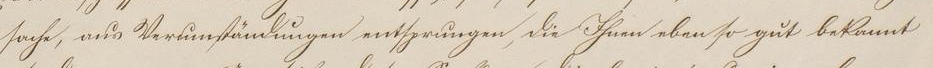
sache, aus Verumständungen entsprungen, die Ihnen eben so gut bekannt
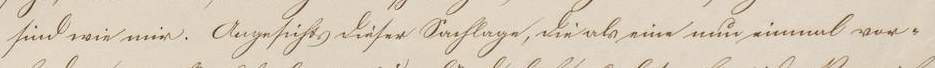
sind wie mir. Angesichts dieser Sachlage, die als eine nun einmal vor-
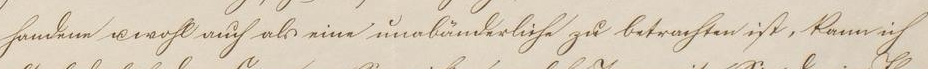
handene & wohl auch als eine unabänderliche zu betrachten ist, kann ich
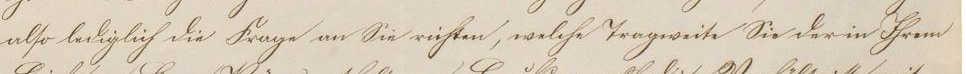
also lediglich die Frage an Sie richten, welche Tragweite Sie der in Ihrem
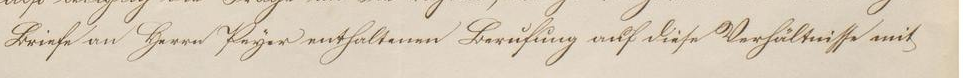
Briefe an Herrn Peyer enthaltenen Berufung auf diese Verhältnisse mit
